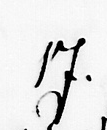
1.)
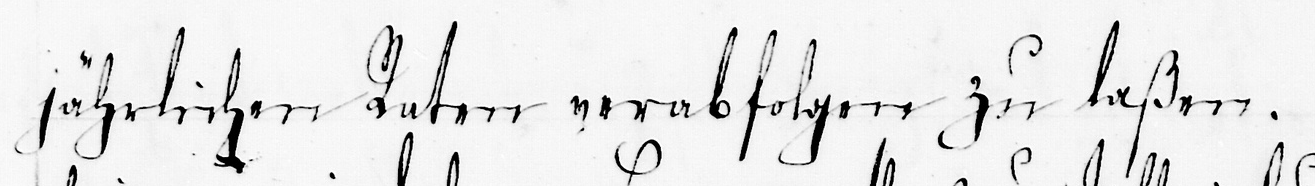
jährlichen Raten verabfolgen zu laßen.
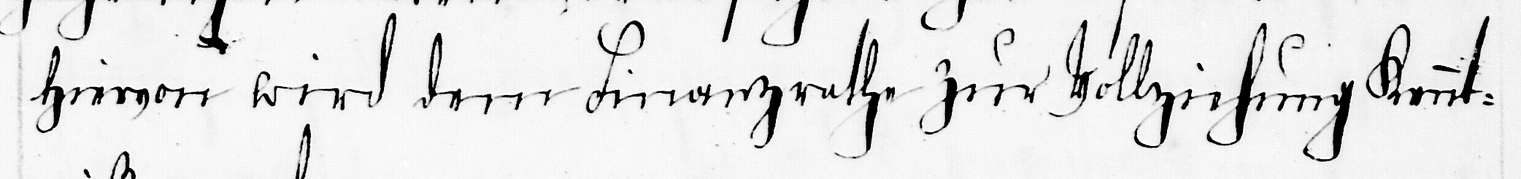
Hiervon wird dem Finanzrathe zur Vollziehung Kennt¬
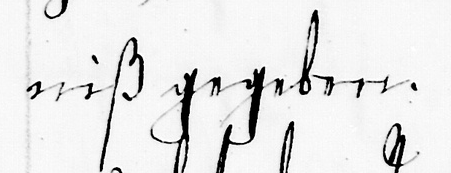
niß gegeben.
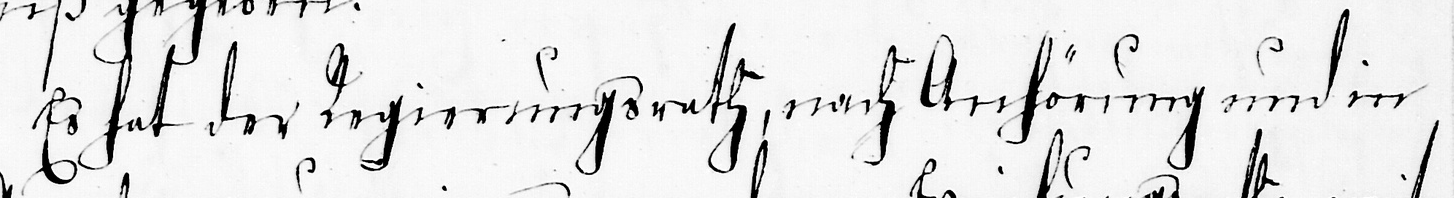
Es hat der Regierungsrath, nach Anhörung und in
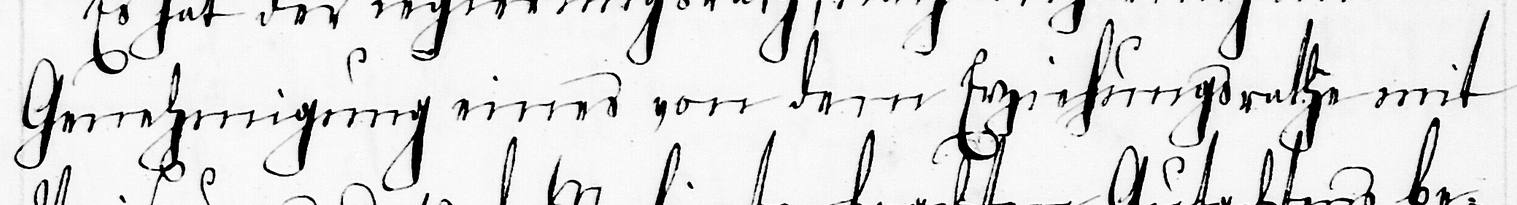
Genehmigung eines von dem Erziehungsrathe mit
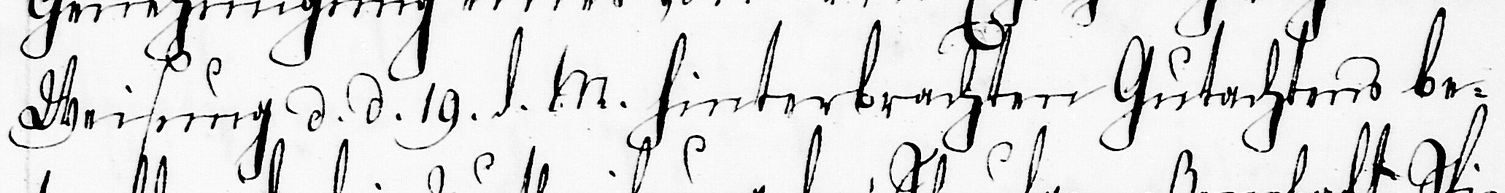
Weisung d. d. 19. d. M. hinterbrachten Gutachtens be¬
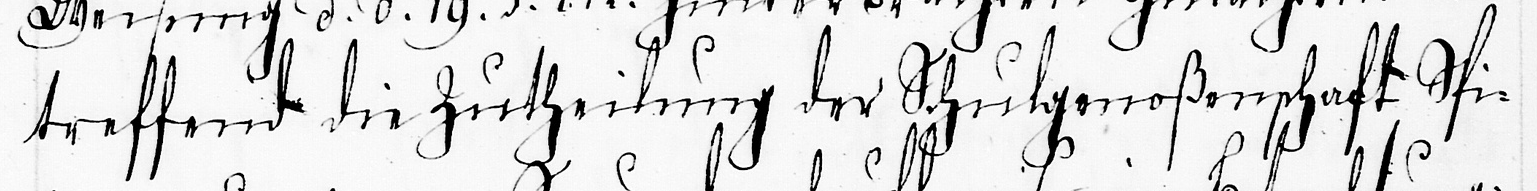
treffend die Zutheilung der Schulgenoßenschaft Spi¬
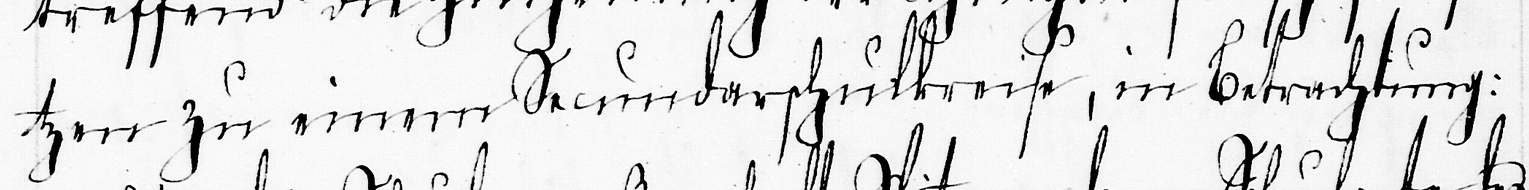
tzen zu einem Secundarschulkreise, in Betrachtung:
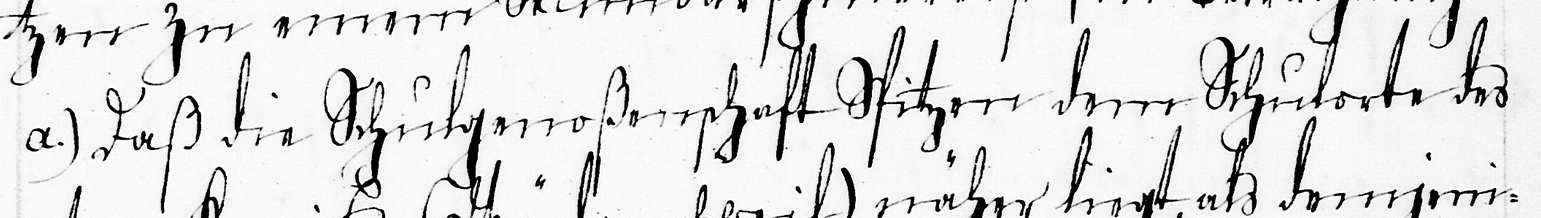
a.) Daß die Schulgenoßenschaft Spitzen dem Schulorte des
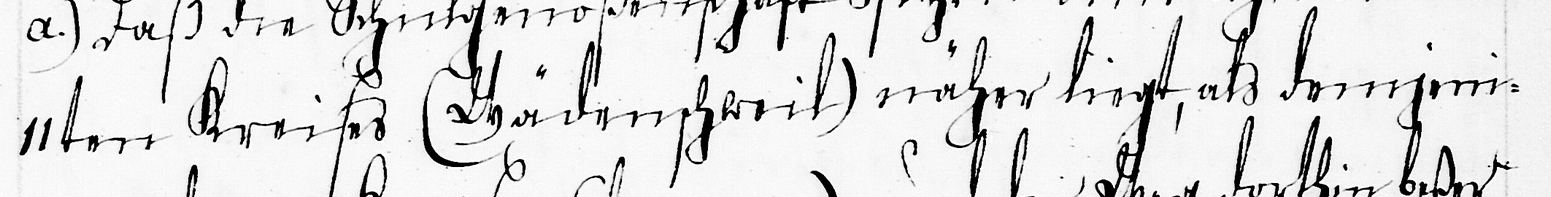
11ten Kreises (Wädenschweil) näher liegt, als demjeni¬
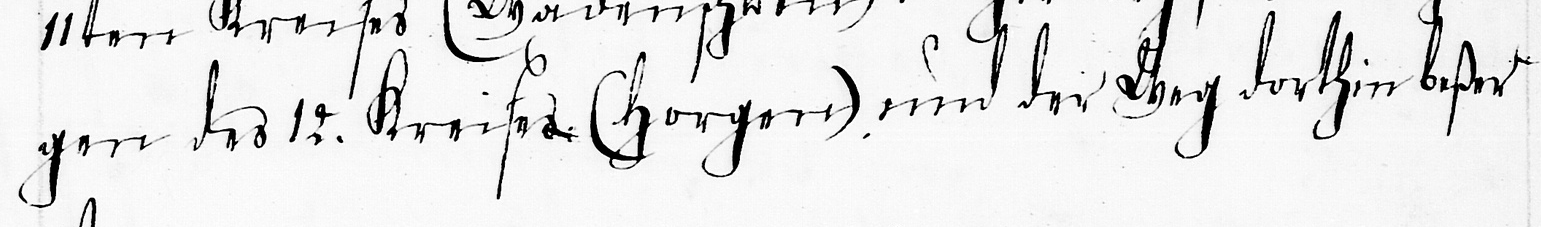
gen des 12. Kreises (Horgen) und der Weg dorthin beßer
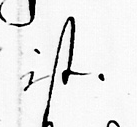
ist.
